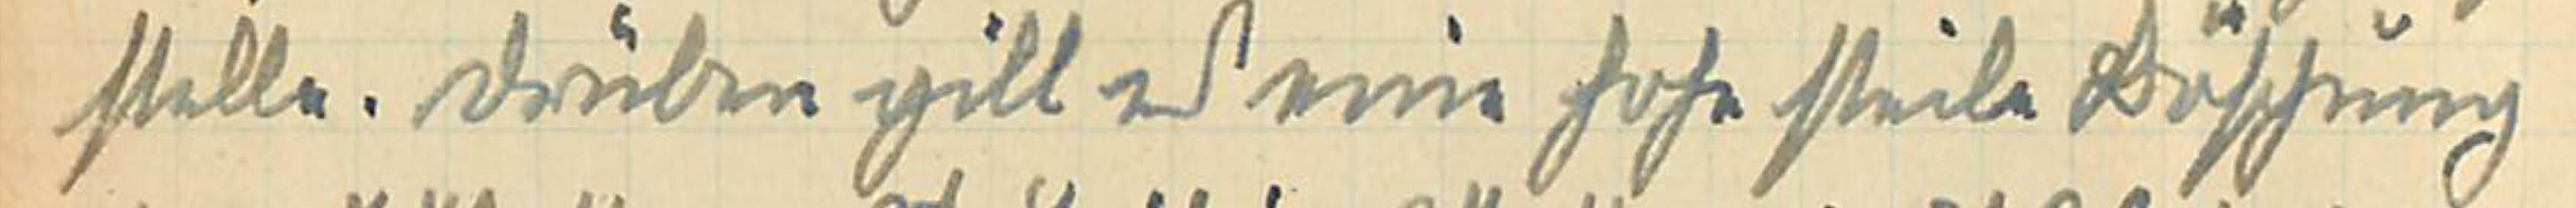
stelle. Drüben gilt es eine hohe steile Böschung
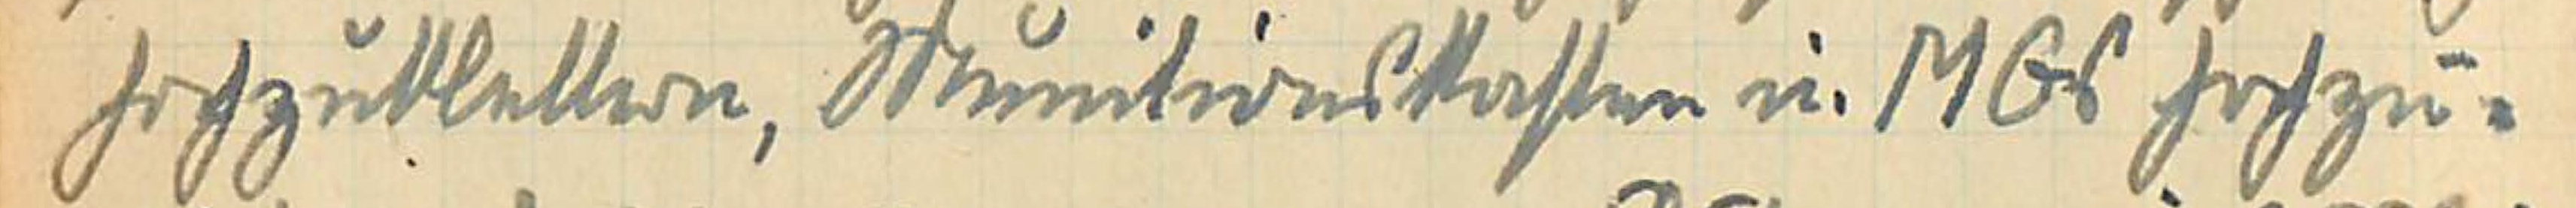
hochzuklettern, Munitionskasten u. MGs hochzu-
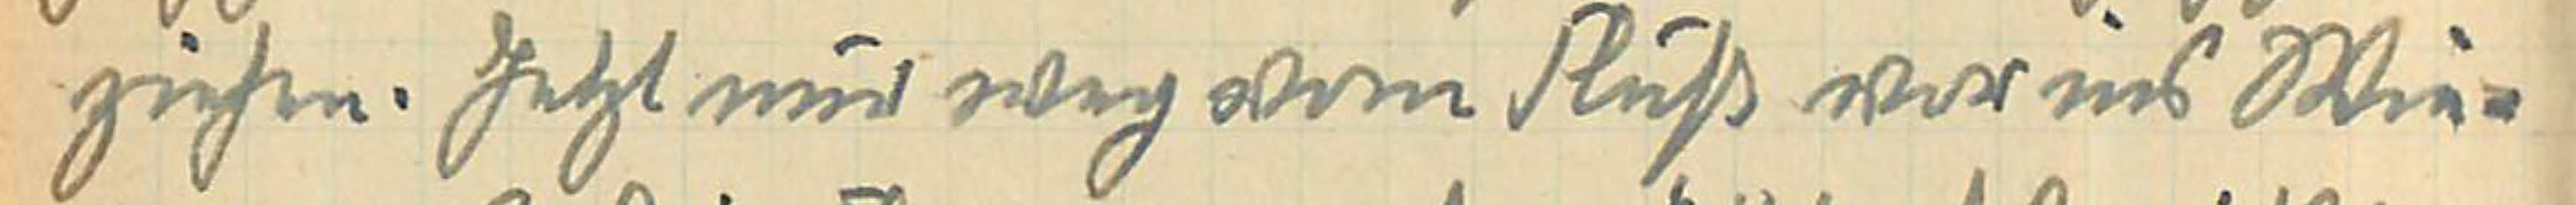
ziehen. Jetzt nur weg vom Fluß vor ins Wie-
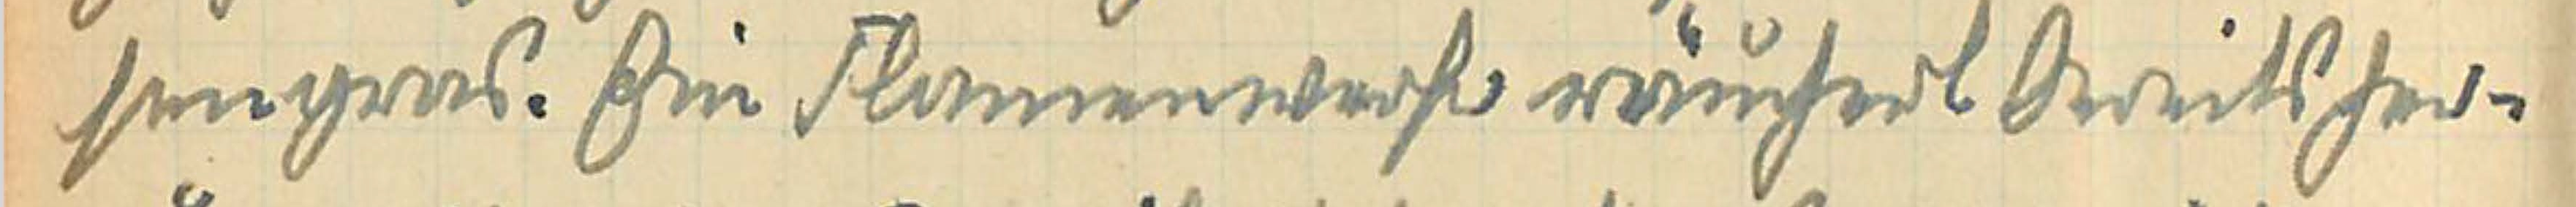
sengras. Ein Flammenwerfer räuchert bereits her-
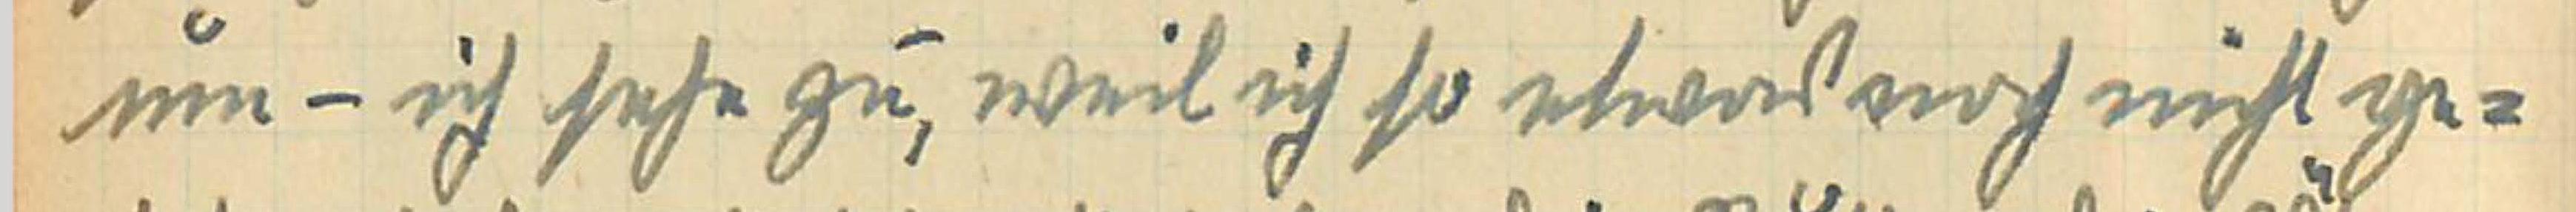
um – ich sehe zu, weil ich so etwas noch nicht ge-
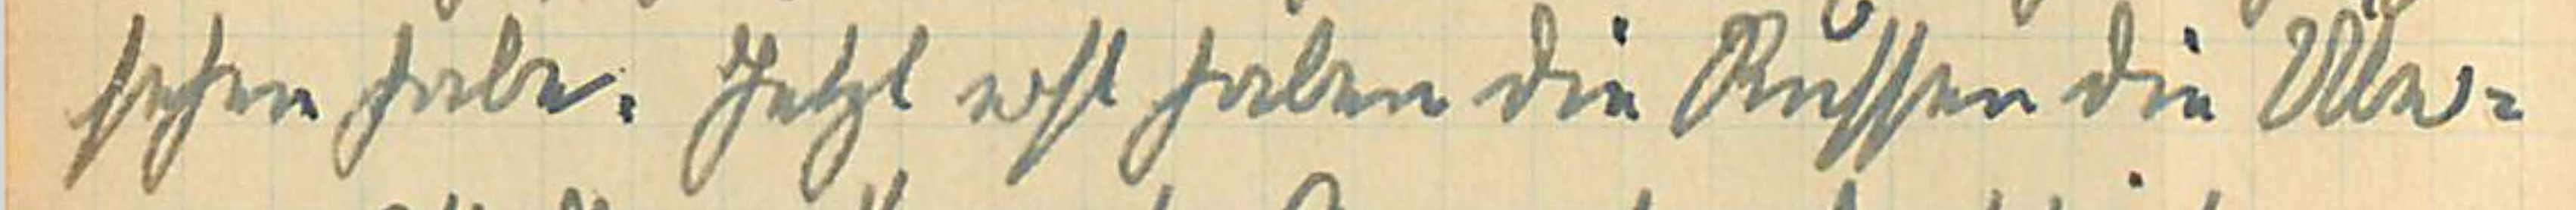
sehen habe. Jetzt erst haben die Russen die Über-
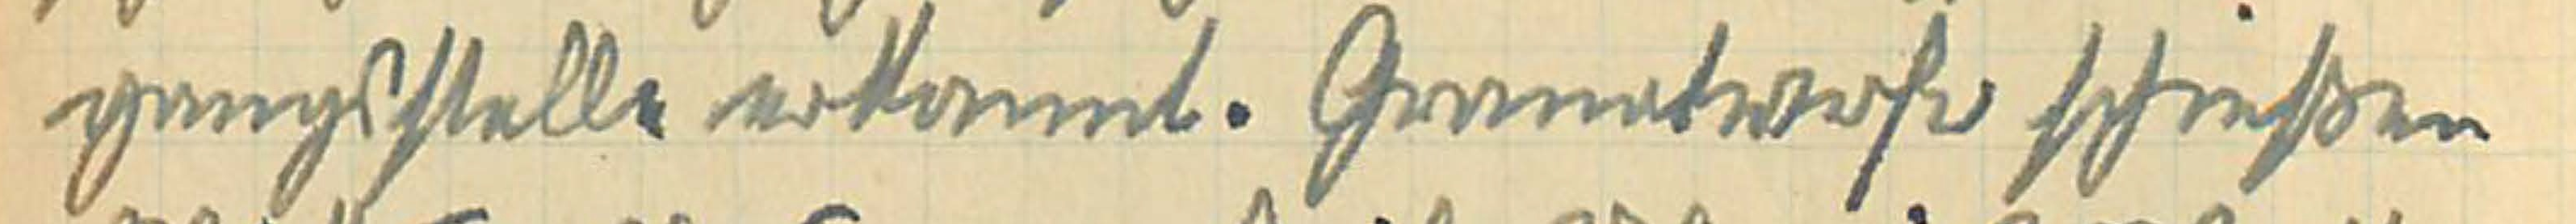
gangsstelle erkannt. Granatwerfer schießen
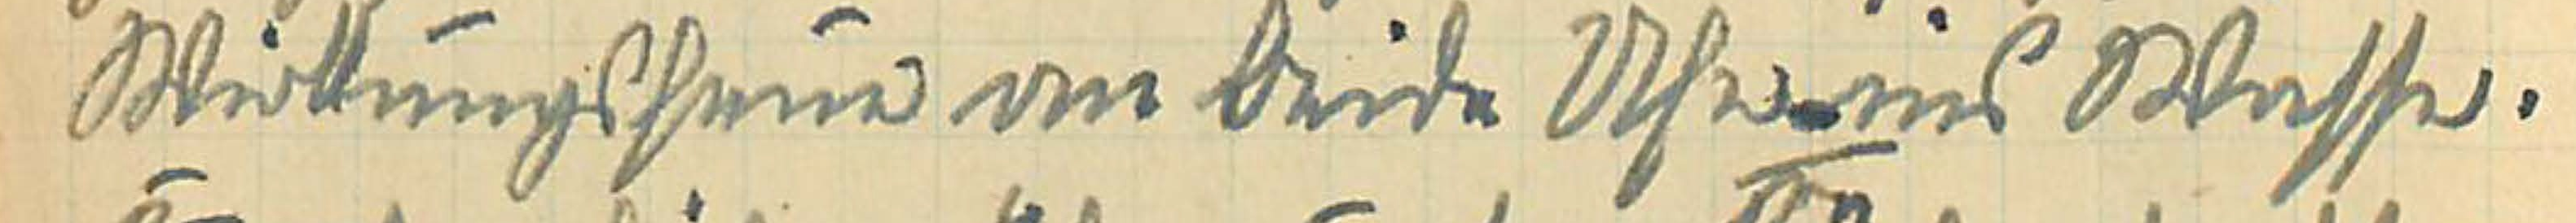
Wirkungsfeuer an beide Ufer ins Wasser.
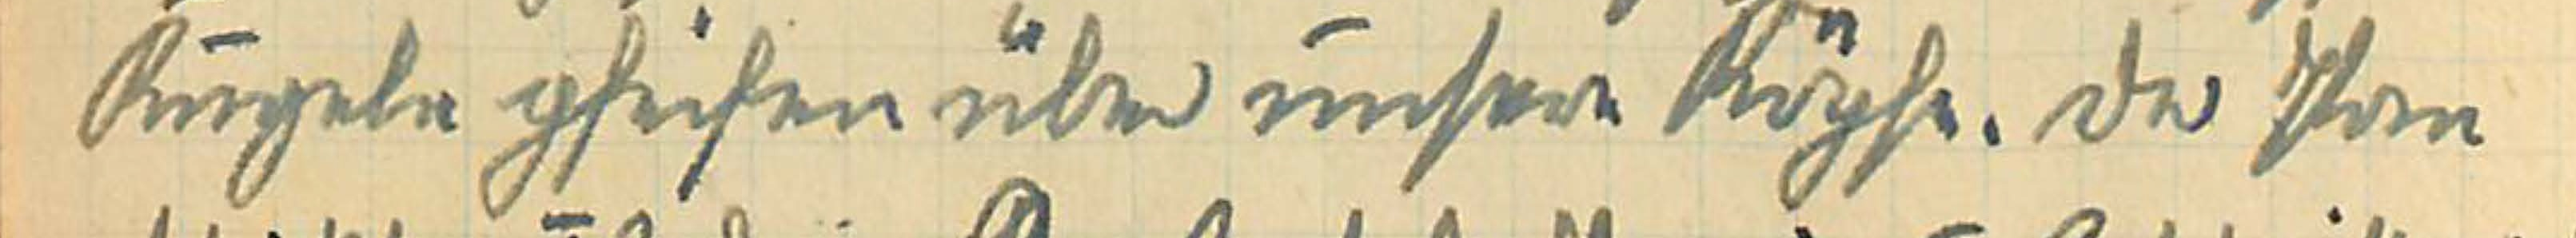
Kugeln pfeifen über unsere Köpfe. Der Pan
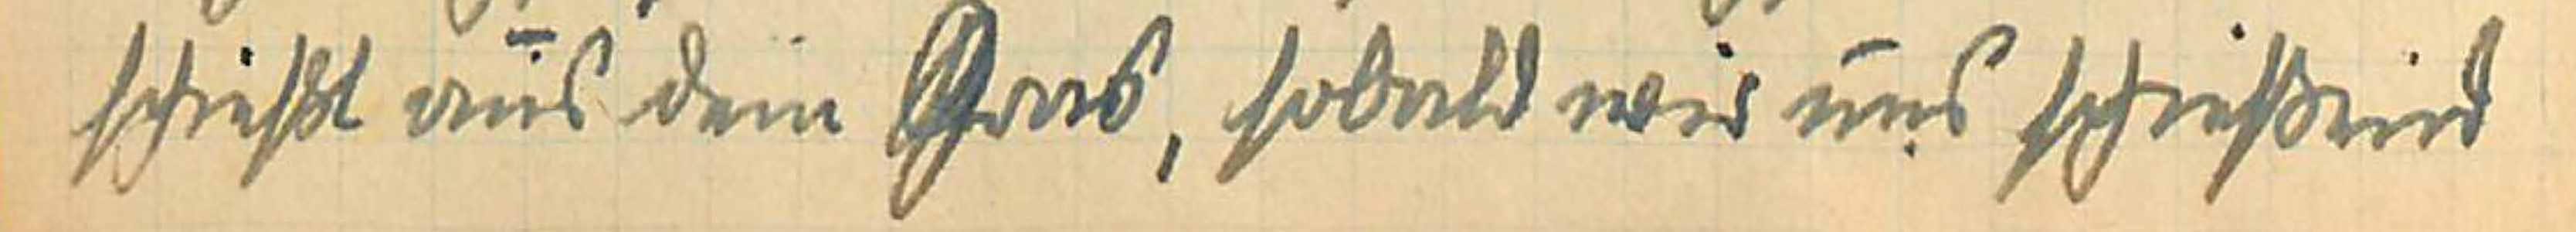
schießt aus dem Gras, sobald wir uns schießend
